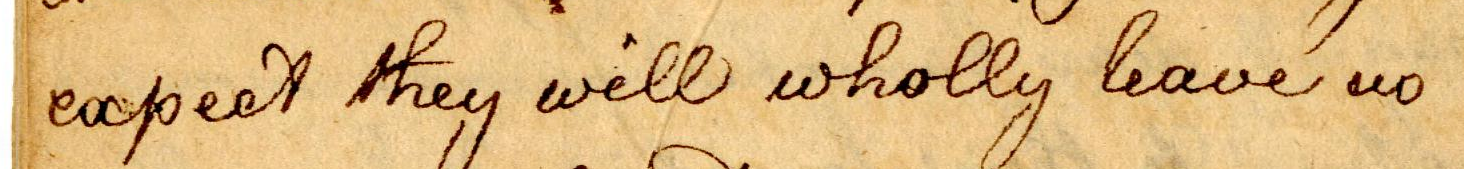expect they will wholly leave us
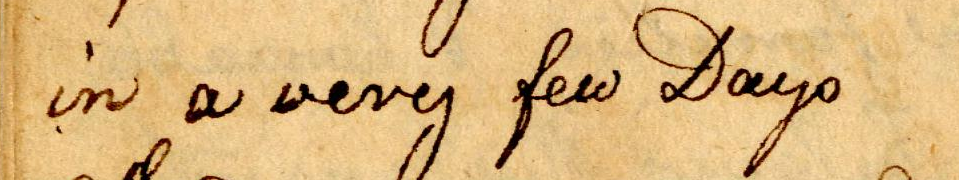in a very few Days
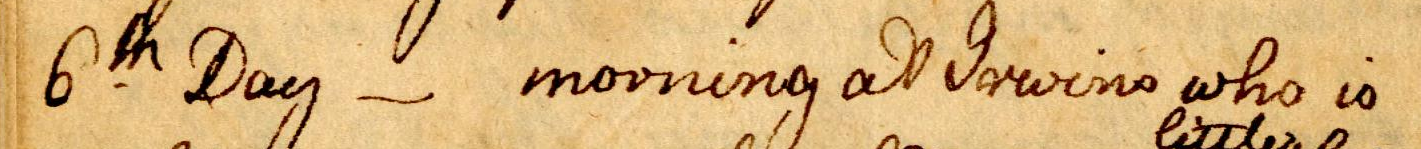6^th Day- morning at Irwins who is
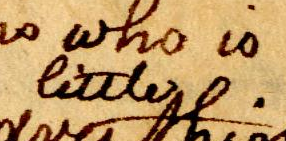little
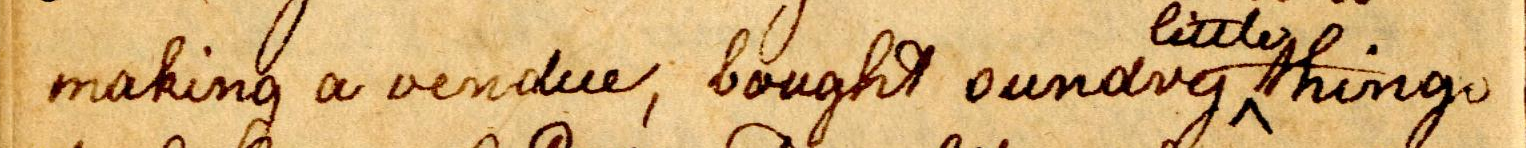making a vendue, bought sundry ^ things
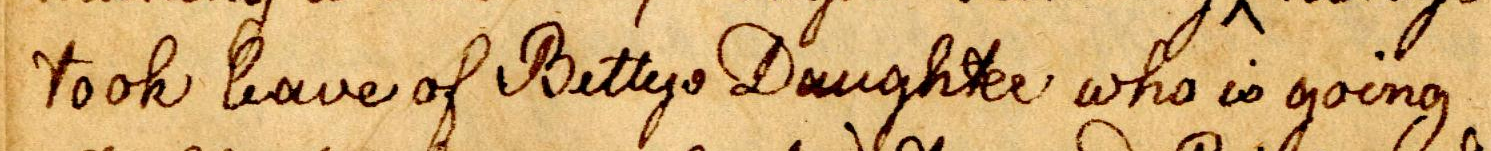took leave of Bettys Daughter who is going
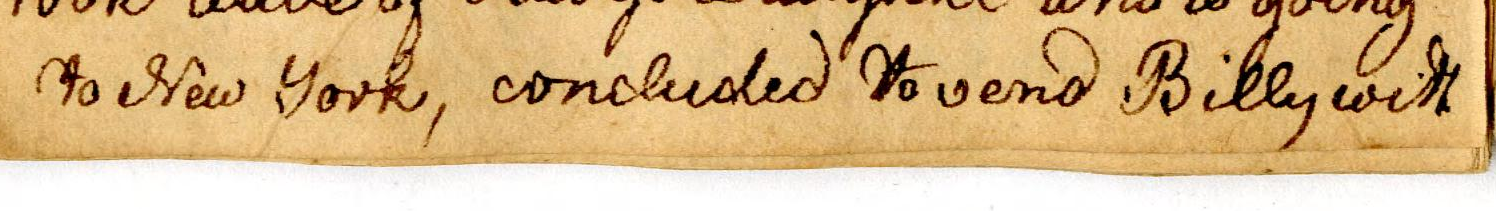to New York, concluded to send Billy with
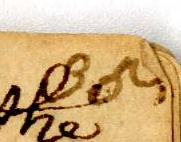35
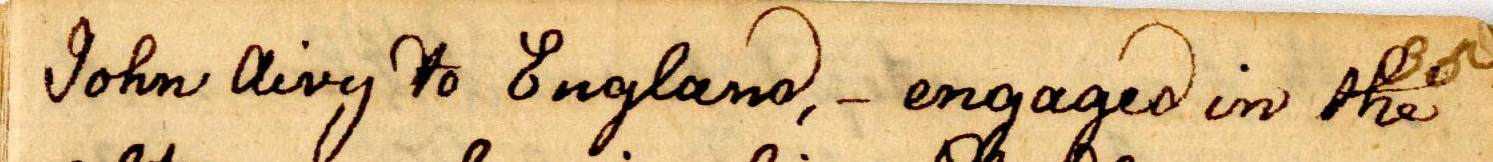John Airy to England,- engaged in the
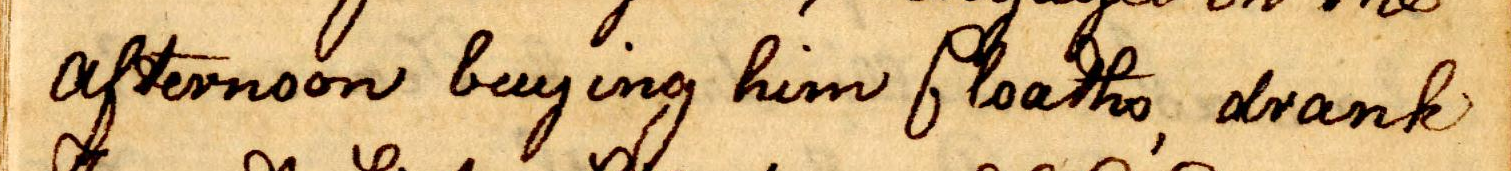Afternoon buying him Cloaths, drank
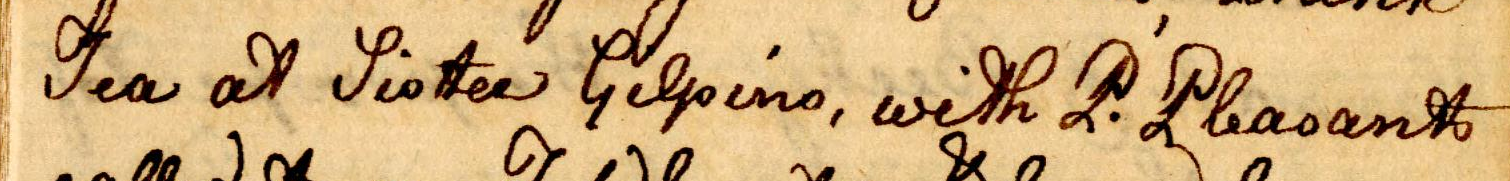Tea at Sister Gilpins, with P. Pleasants
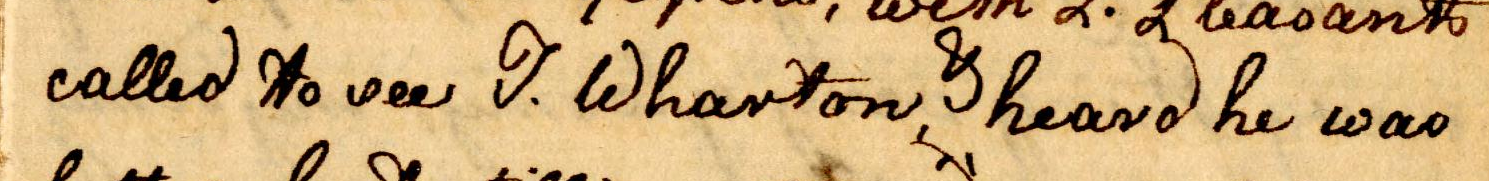called to see T. Wharton, & heard he was
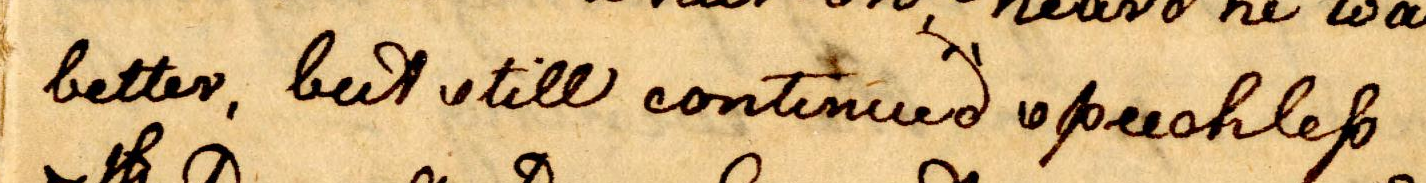better, but still continued speechless
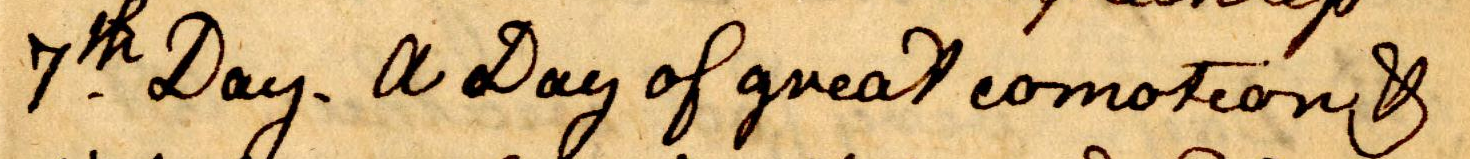7^th Day- A Day of great comotion &
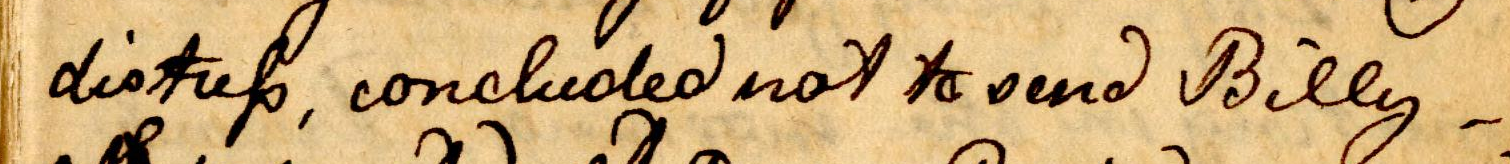distress, concluded not to send Billy-
